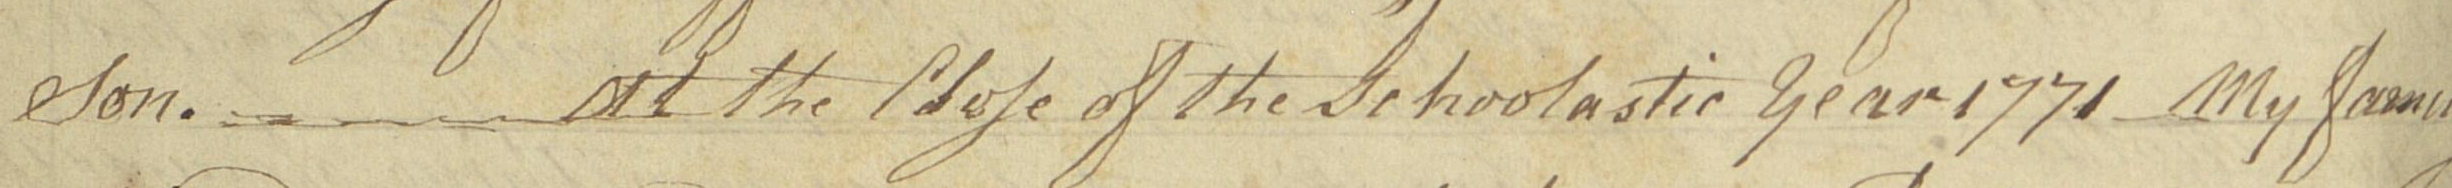son. At the Close of the Schoolastic Year 1771 My family
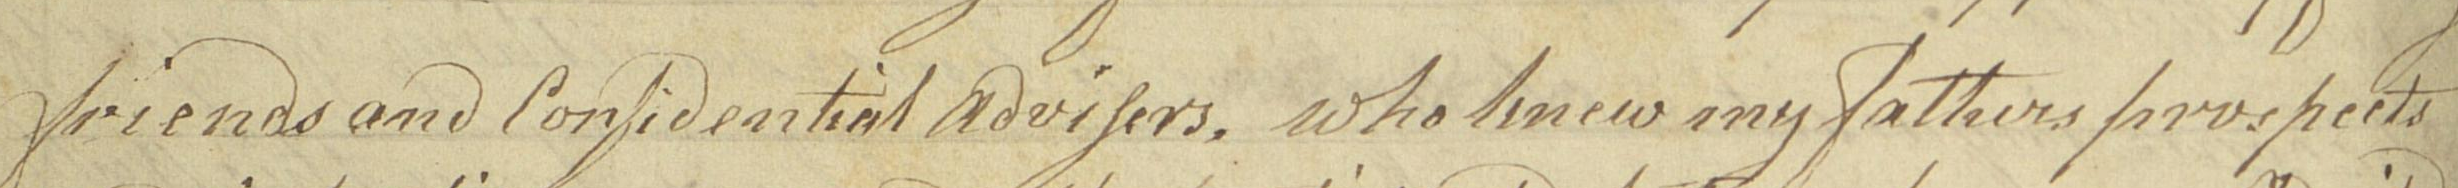friends and Confidential advisers. who knew my fathers prospects
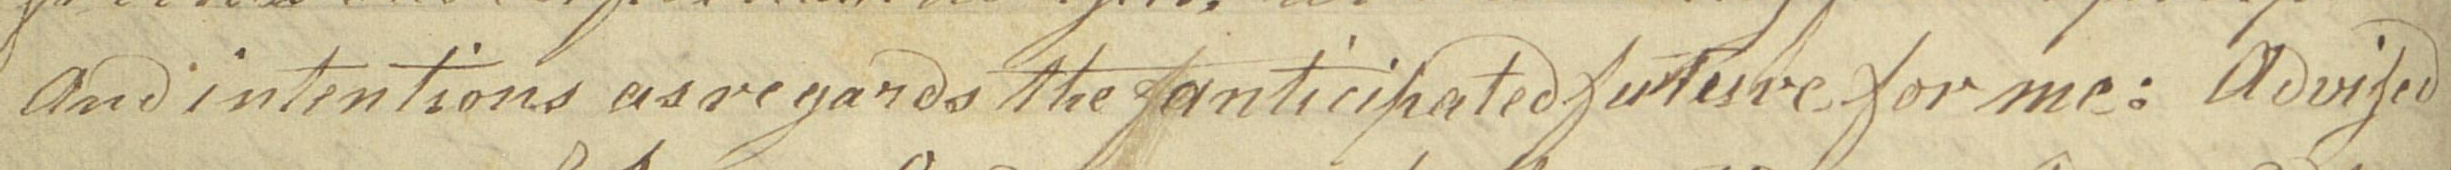and intentions as regards the anticipated future for me: Advised
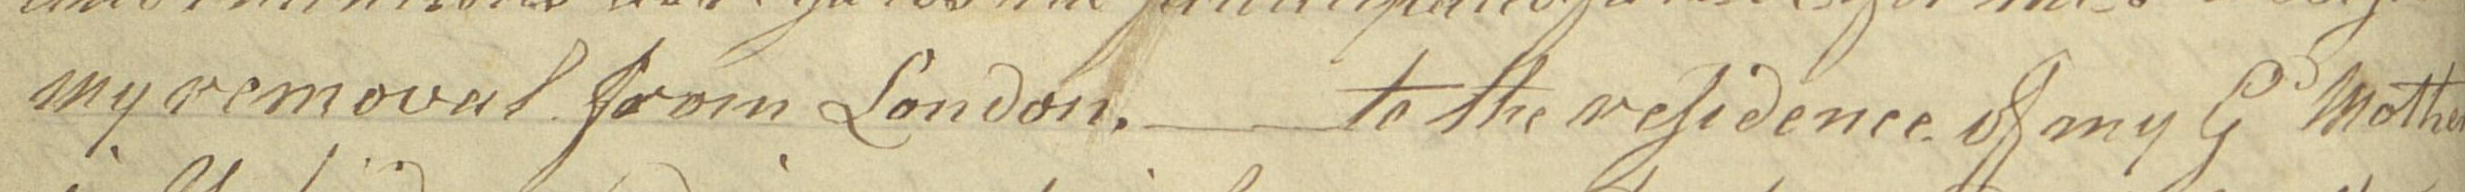my removal from London. to the residence of my G^d Mother
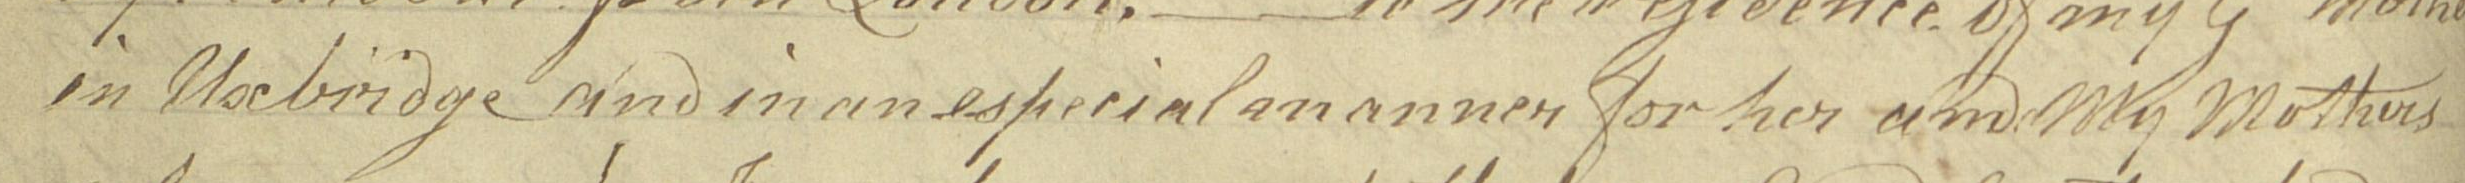in Uxbridge and in an especial manner for her and My Mothers
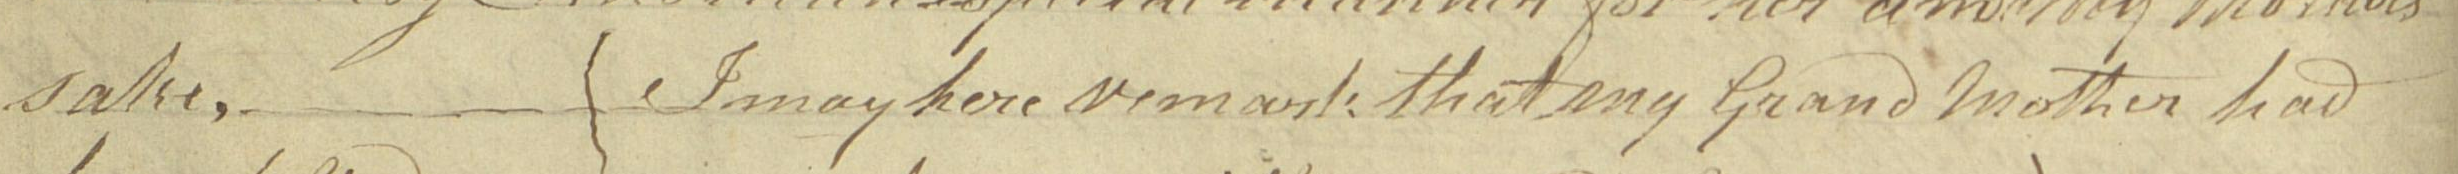sake. (I may here remark that my Grand Mother had
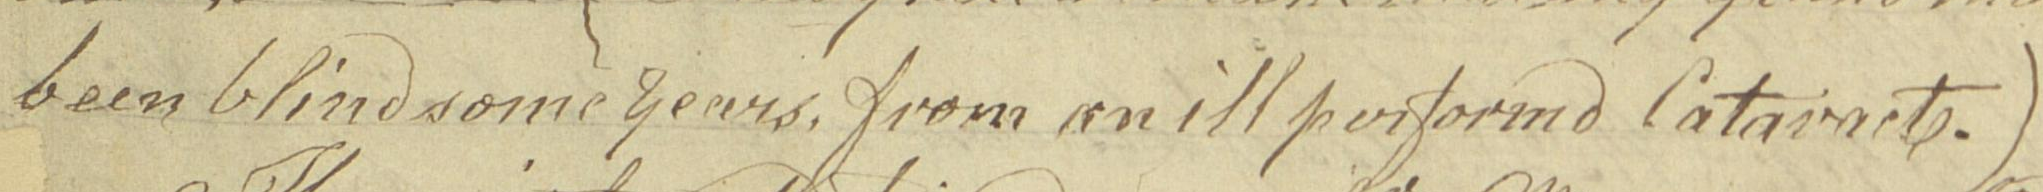been blind some years from untill performed Cataracts.)
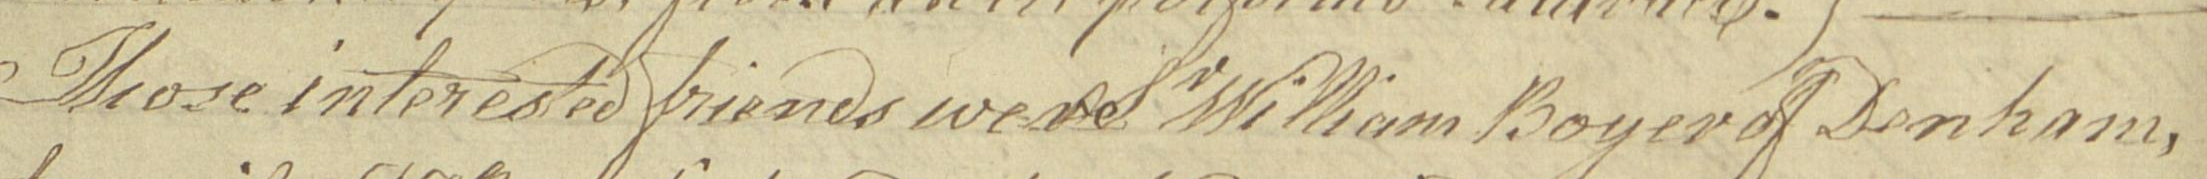Those interested friends were Williaim Boyer of Denham,
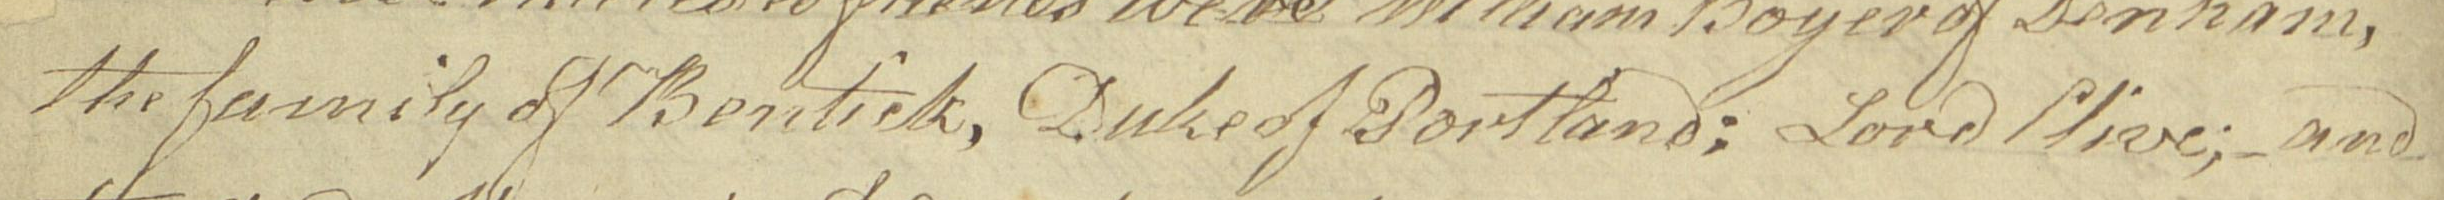the family of Bentick, Duke of Portland; Lord Clive; and
